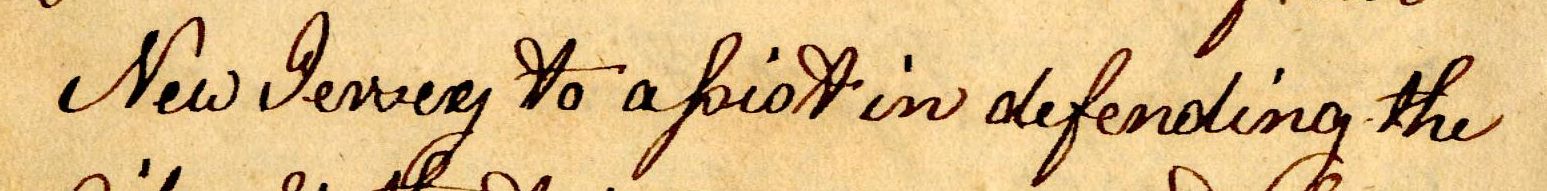New Jersey to assist in defending the
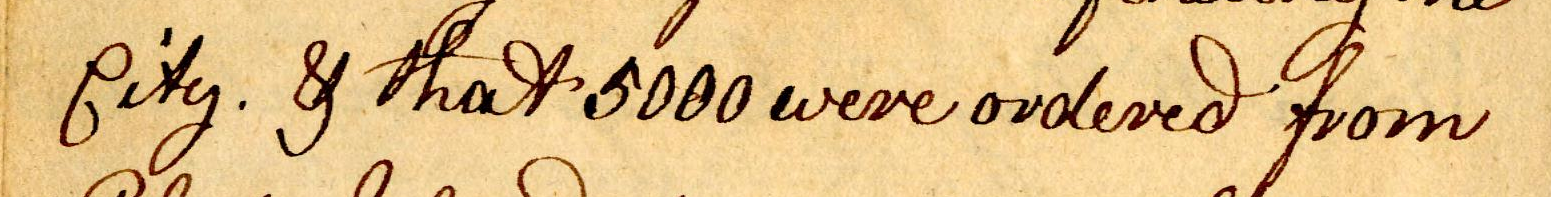City. & that 5000 were ordered from
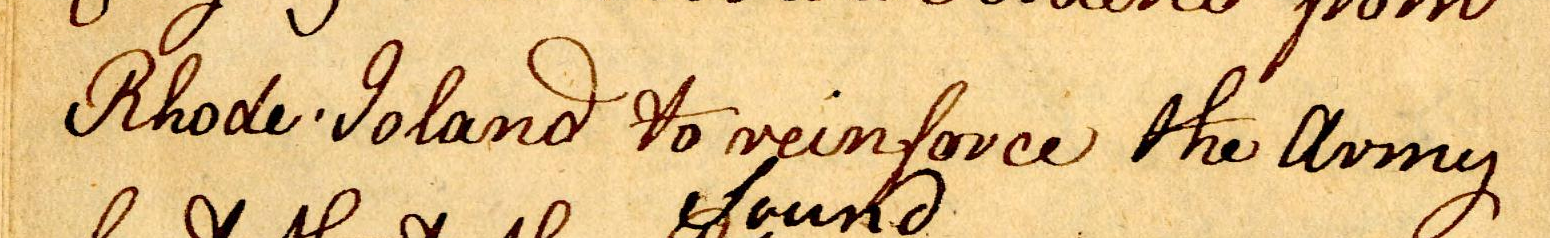Rhode Island to reinforce the Army
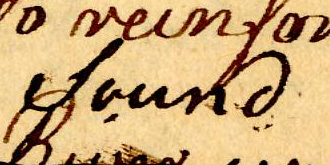sound
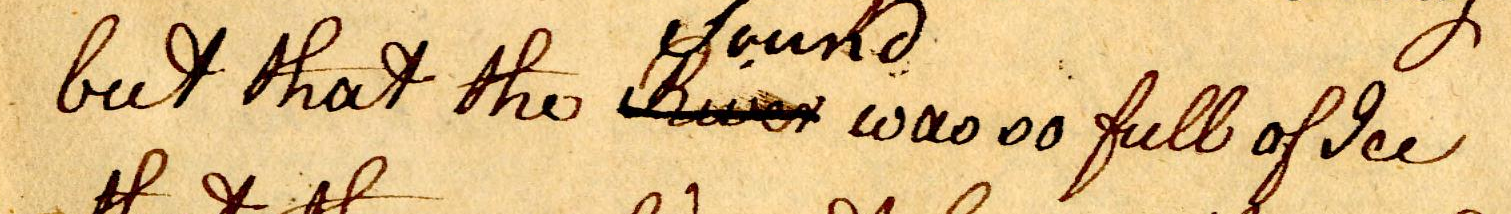but that the [River] was so full of Ice
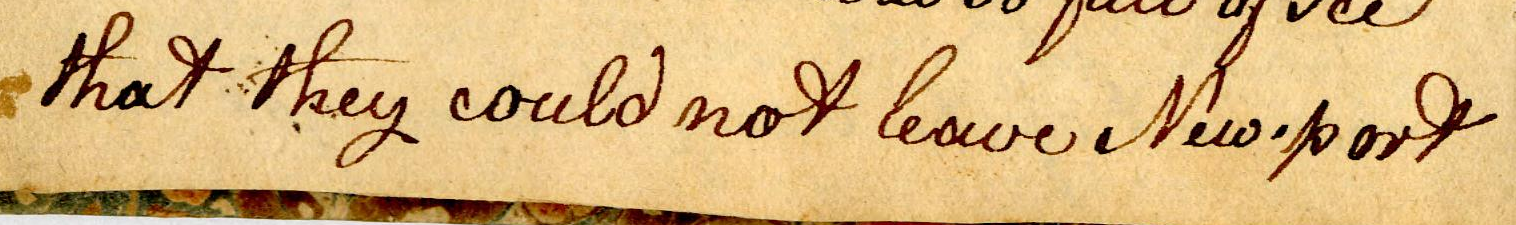that they could not leave New-port
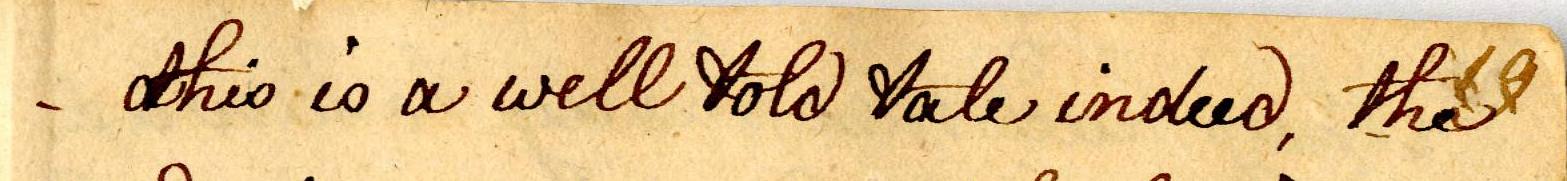this is a well told tale indeed, the
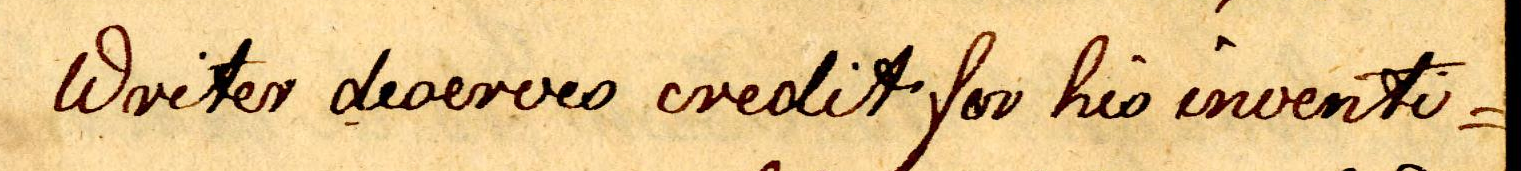Writer deserves credit for his inventi-
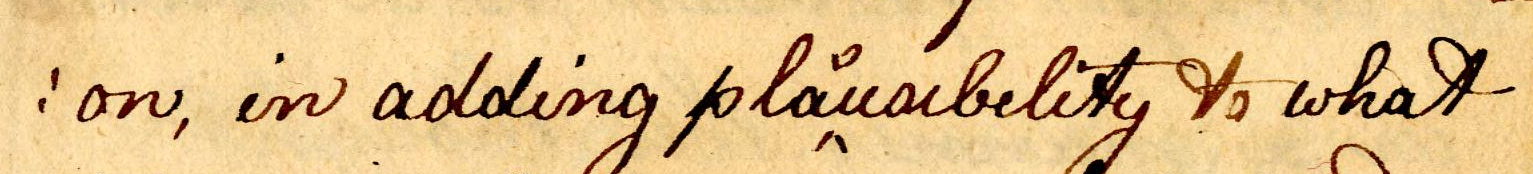-on, in adding pla^susibility to what
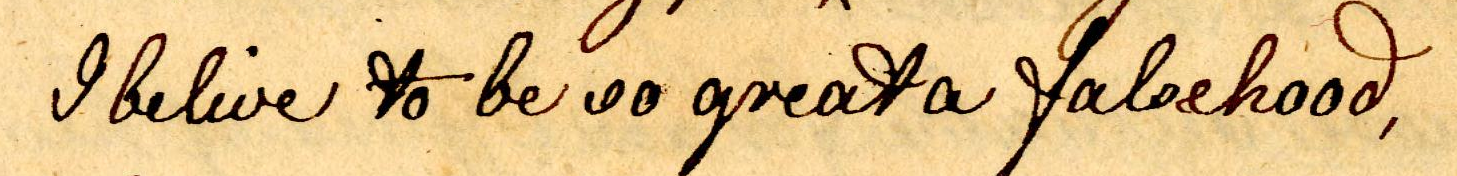I believe to be so great a falsehood,
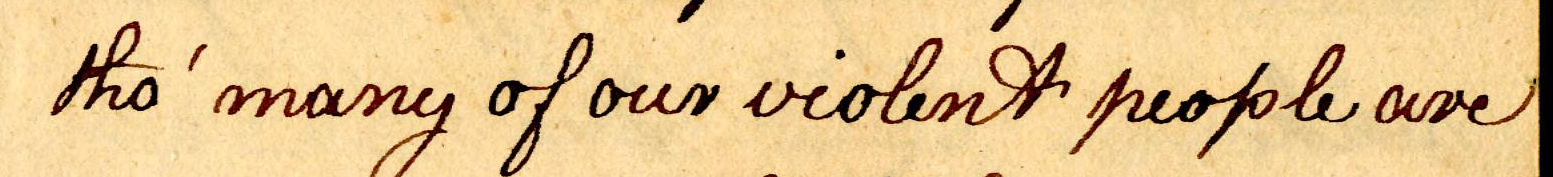tho' many of our violent people are
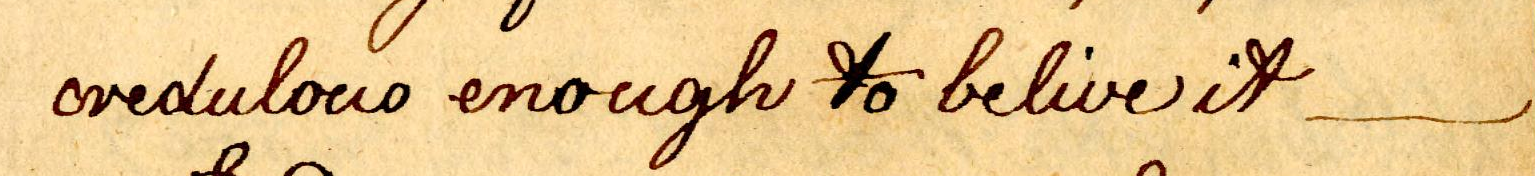credulous enough to belive it -
